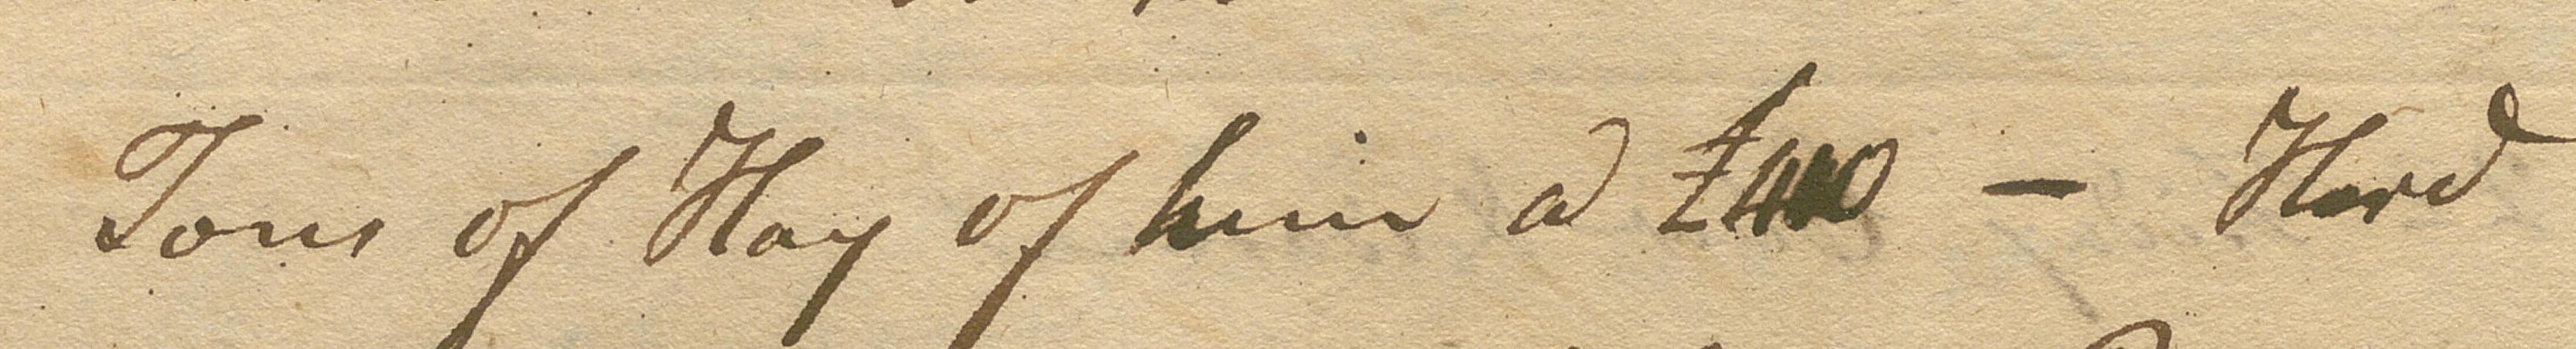Tons of Hay of him @ £400- Hard
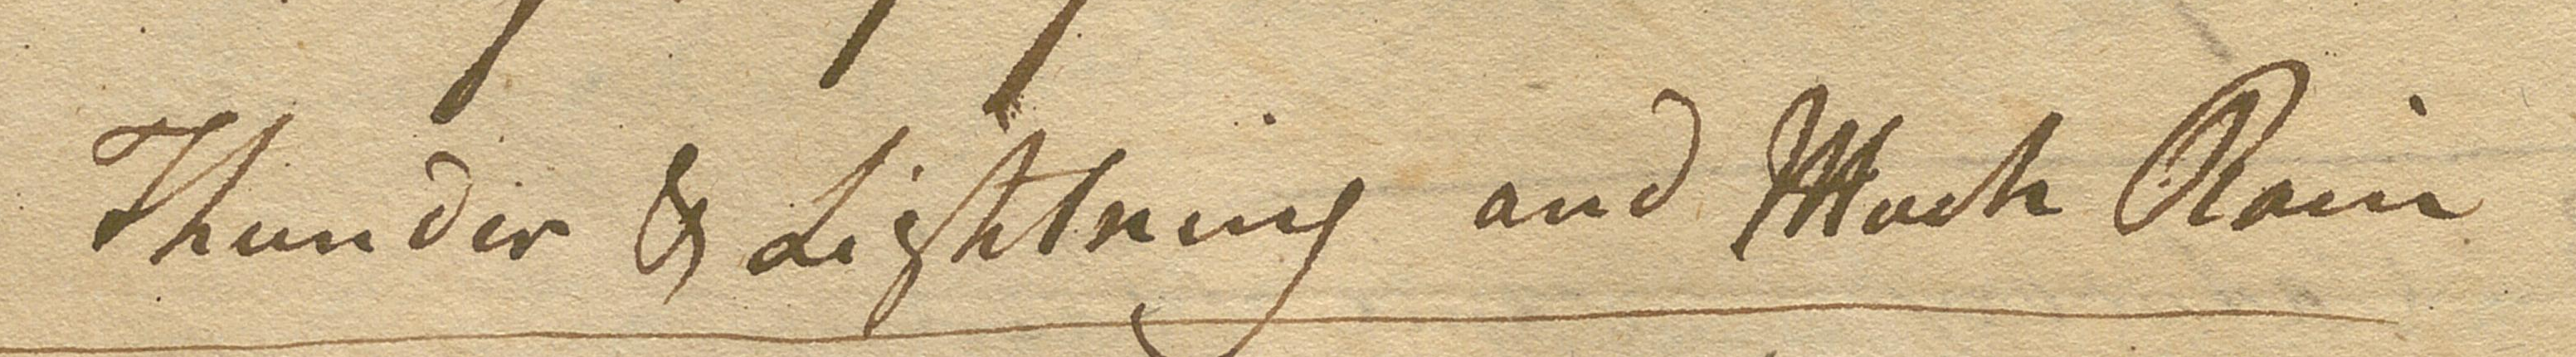Thunder & Lightning and Much Rain
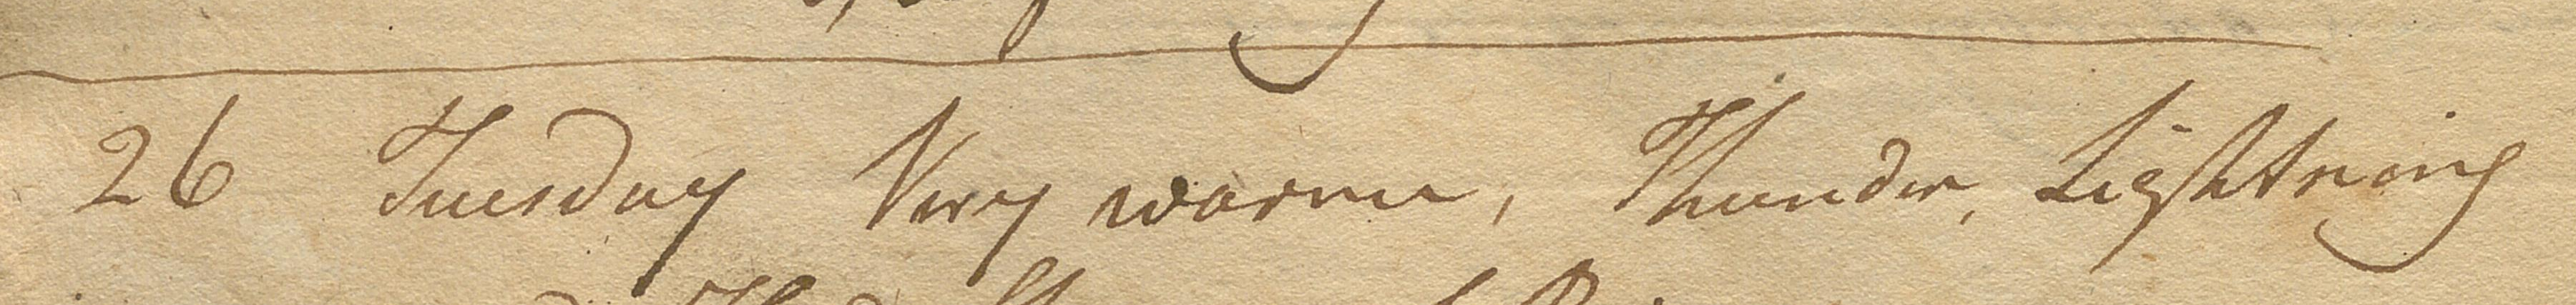26 Tuesday Very warme, Thunder Lightning
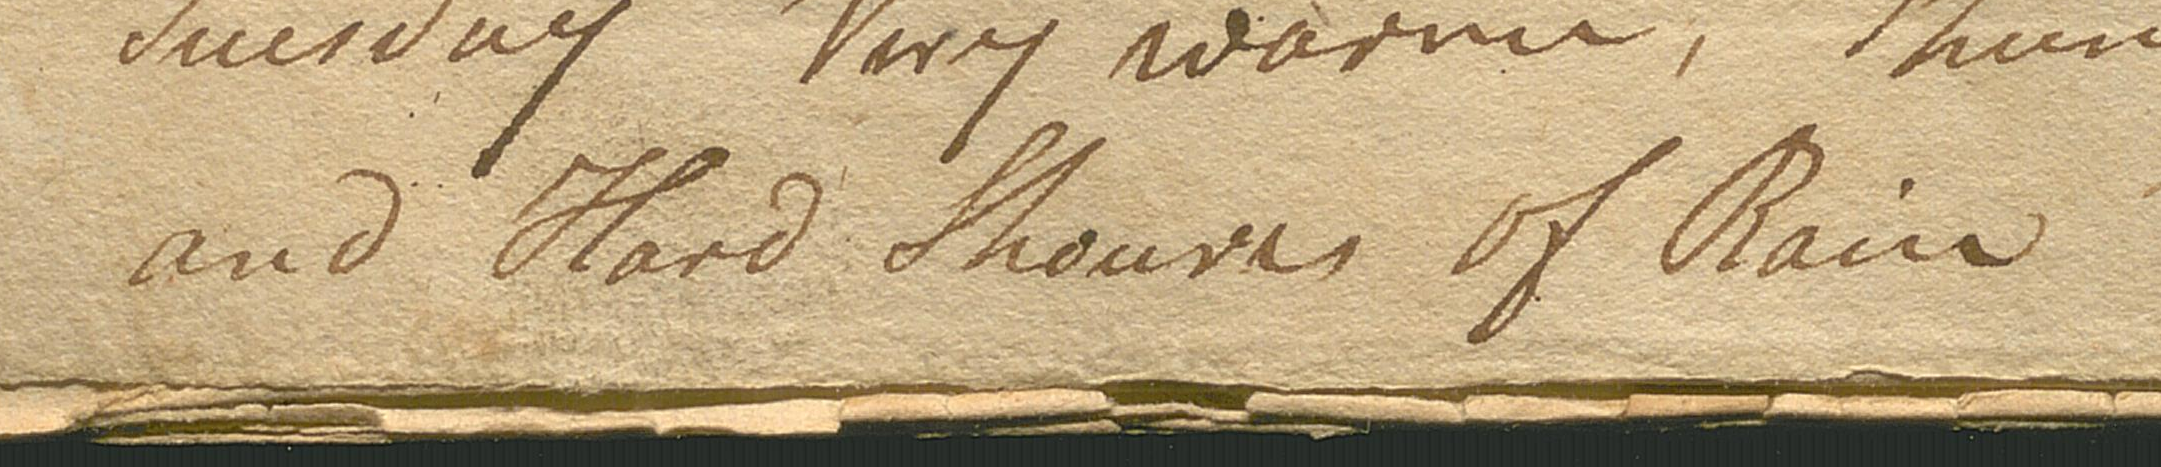aned Hard Shoures of Rain
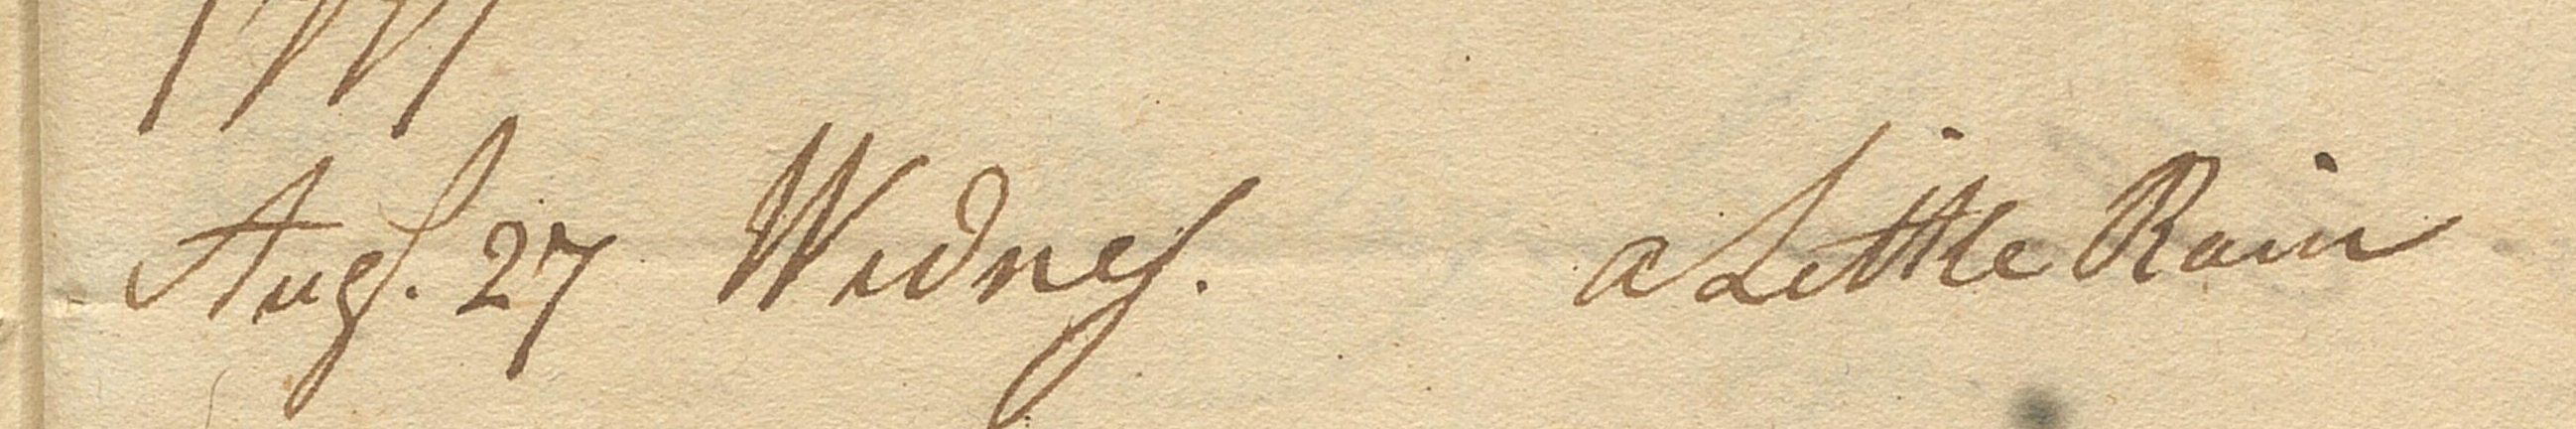Aug^. 27 Wednes. a Little Rain
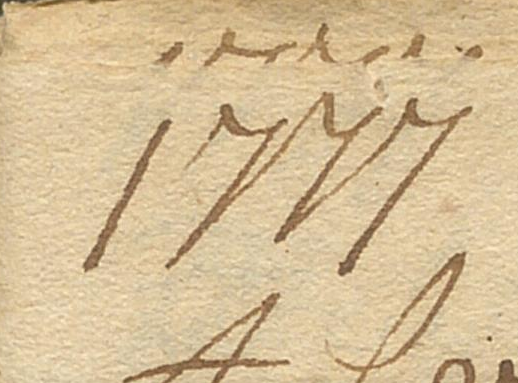1777
